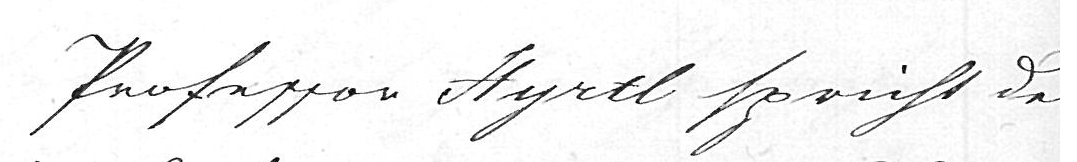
Professor Hyrtl spricht den
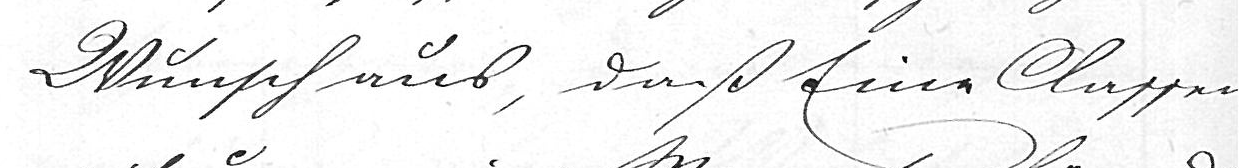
Wunsch aus, daß Eine Classen-
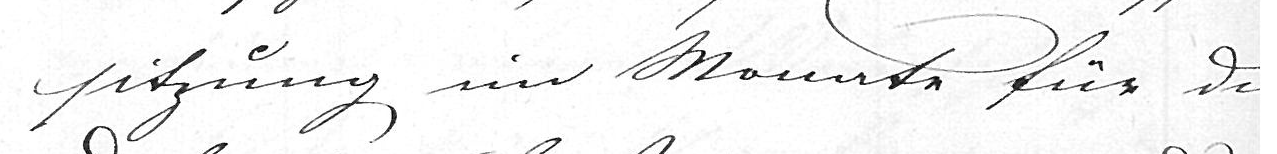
sitzung im Monate für die
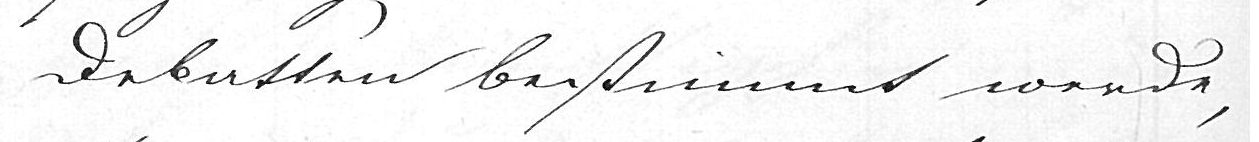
Debatten bestimmt werde,
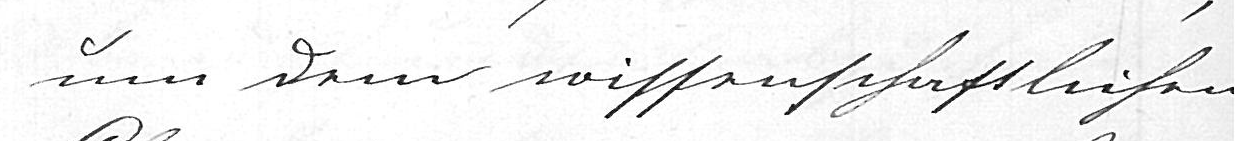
um dem wissenschaftlichen
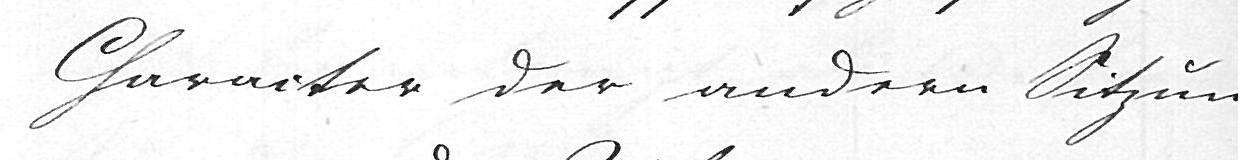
Character der andern Sitzun-
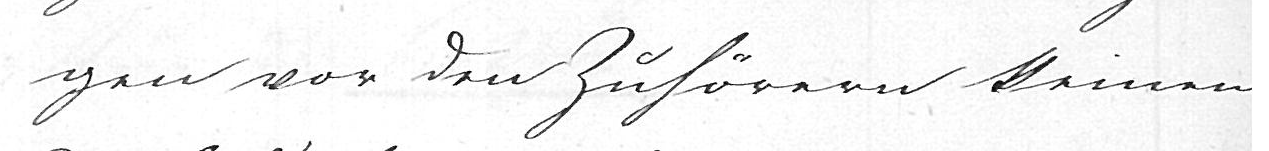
gen vor den Zuhörern keinen
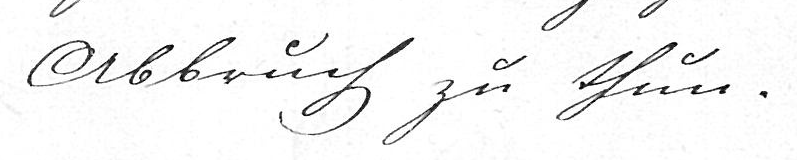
Abbruch zu thun.
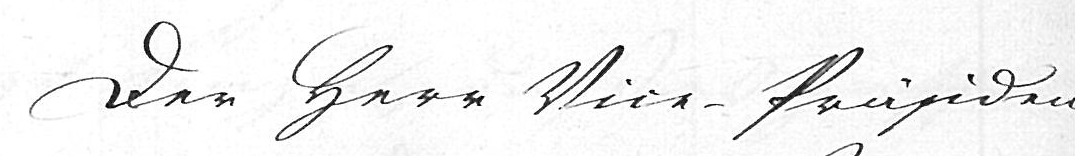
Der Herr Vice-Präsident
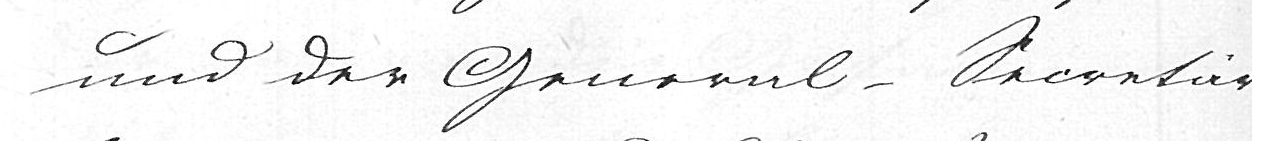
und der General-Secretär
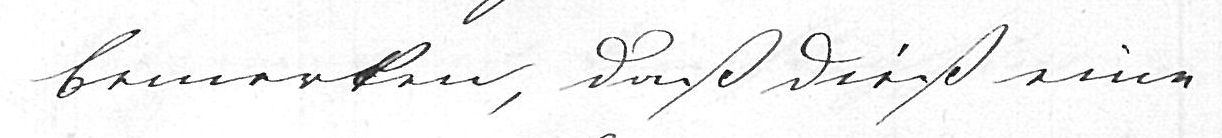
bemerken, daß dieß eine
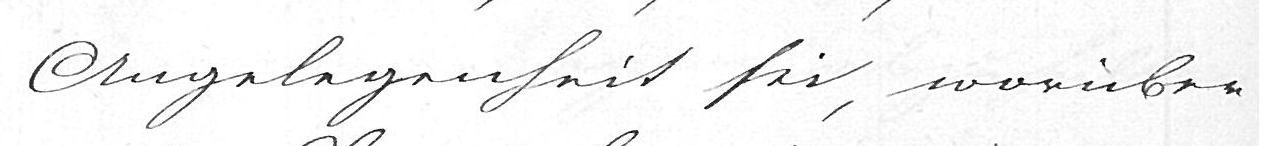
Angelegenheit sei, worüber
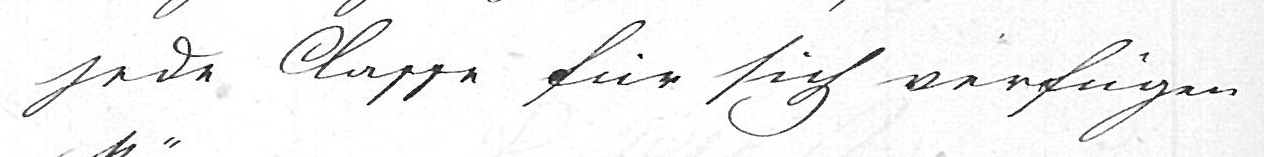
jede Classe für sich verfügen
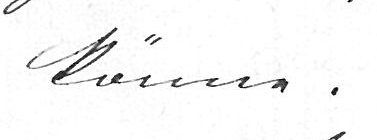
könne.
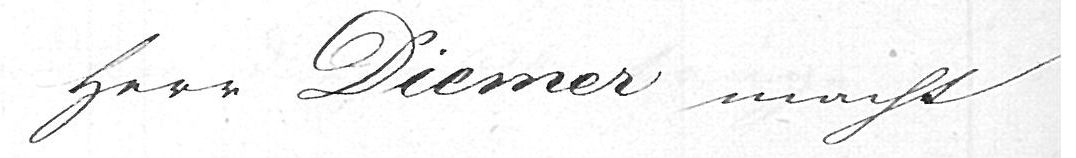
Herr Diemer macht
